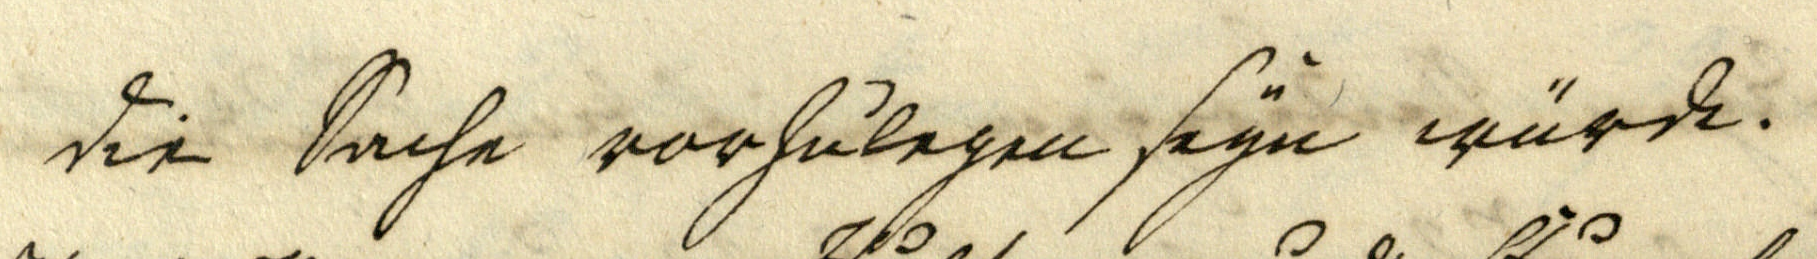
die Sache vorzulegen seyn würde.
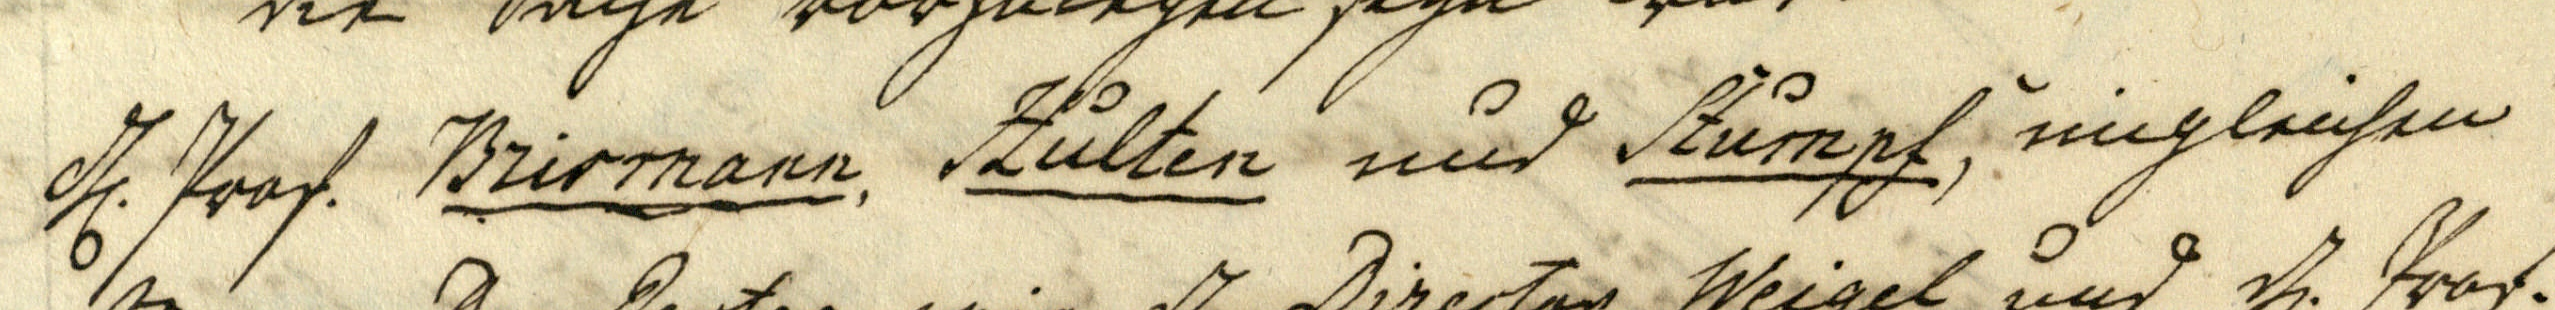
dh. Prof. Brismann, Hulten und Stumpf, imgleichen
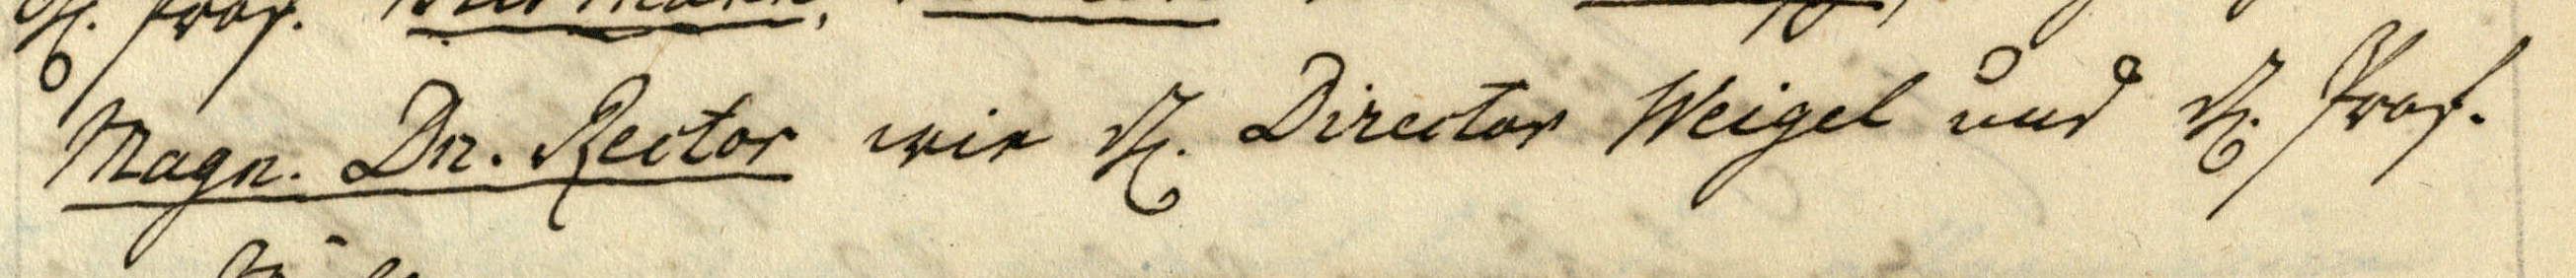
Magn. Dn. Rector wie dh. Director Weigel und dh. Prof.
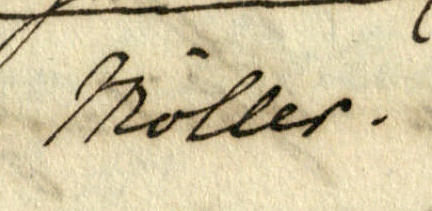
Möller.
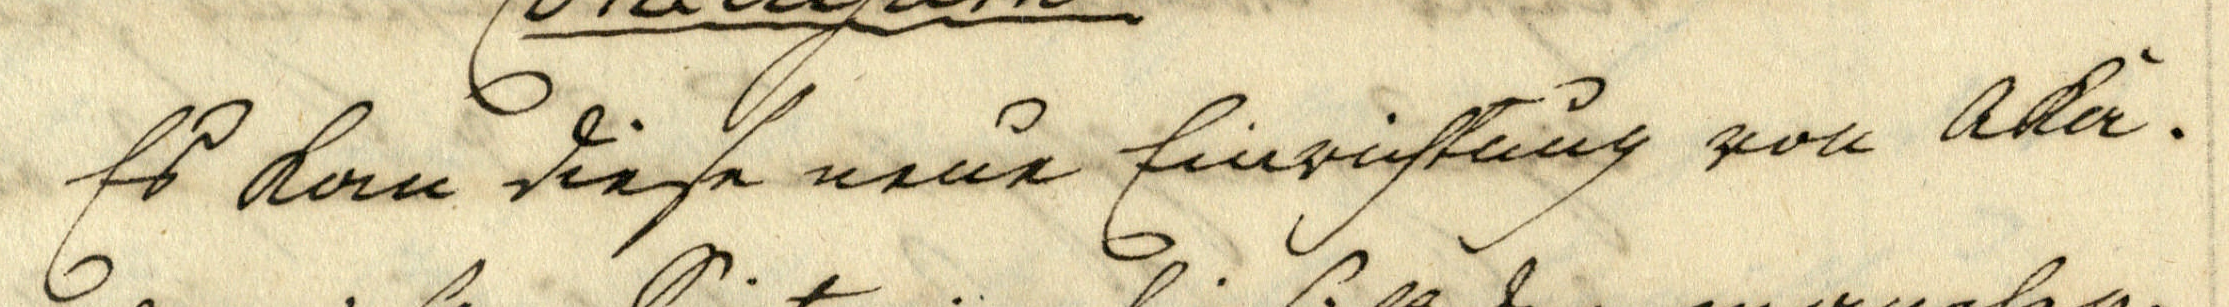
Es kan diese neue Einrichtung von Aka-
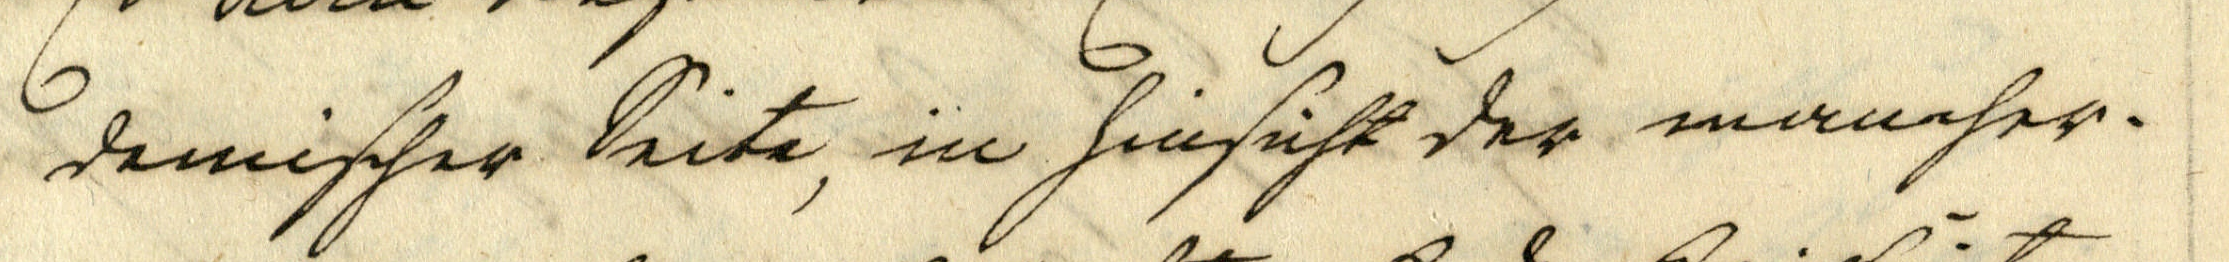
demischer Seite, in Hinsicht der mancher-
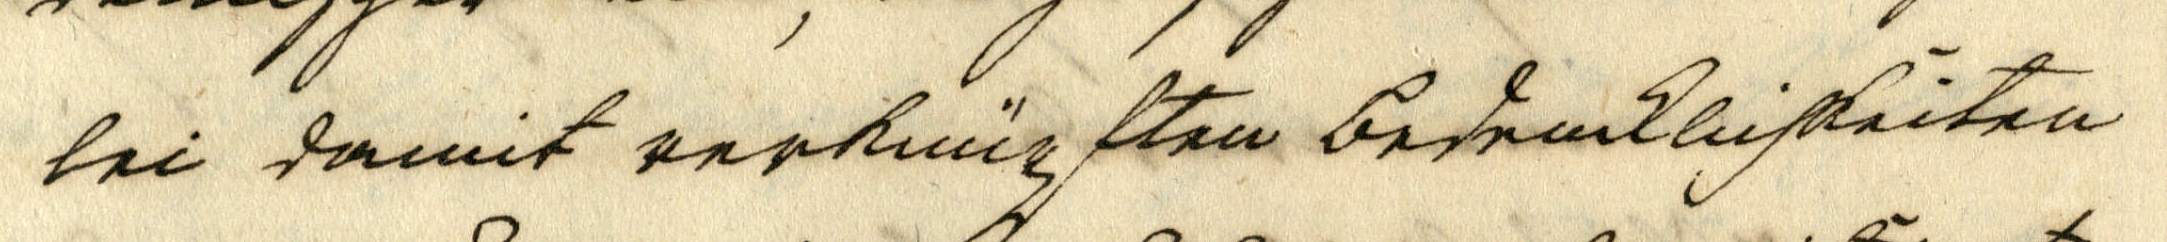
lei damit verknüpften Bedenklichkeiten
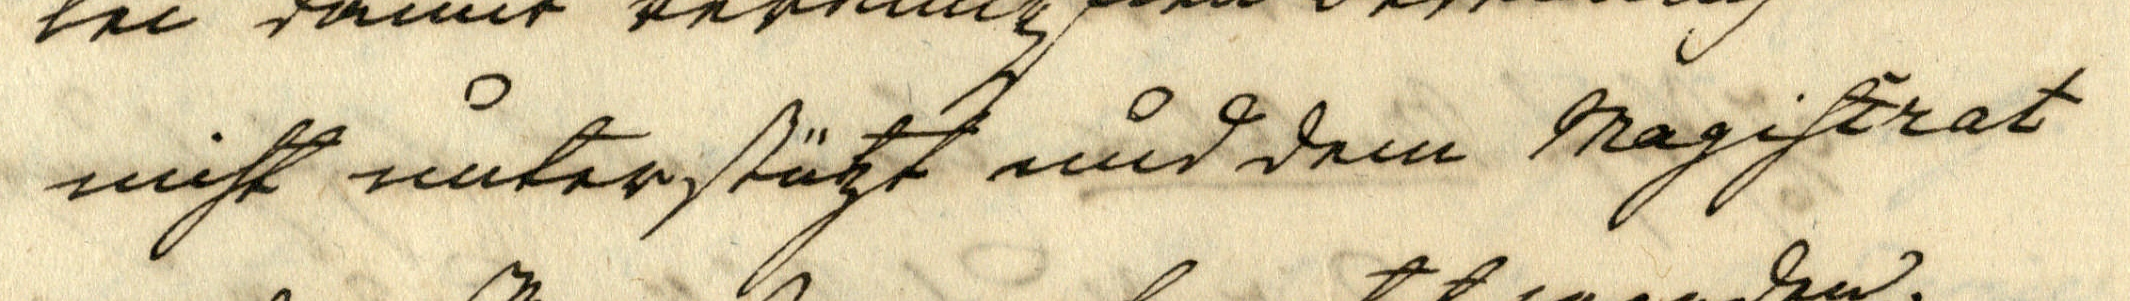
nicht unterstützt und dem Magistrat
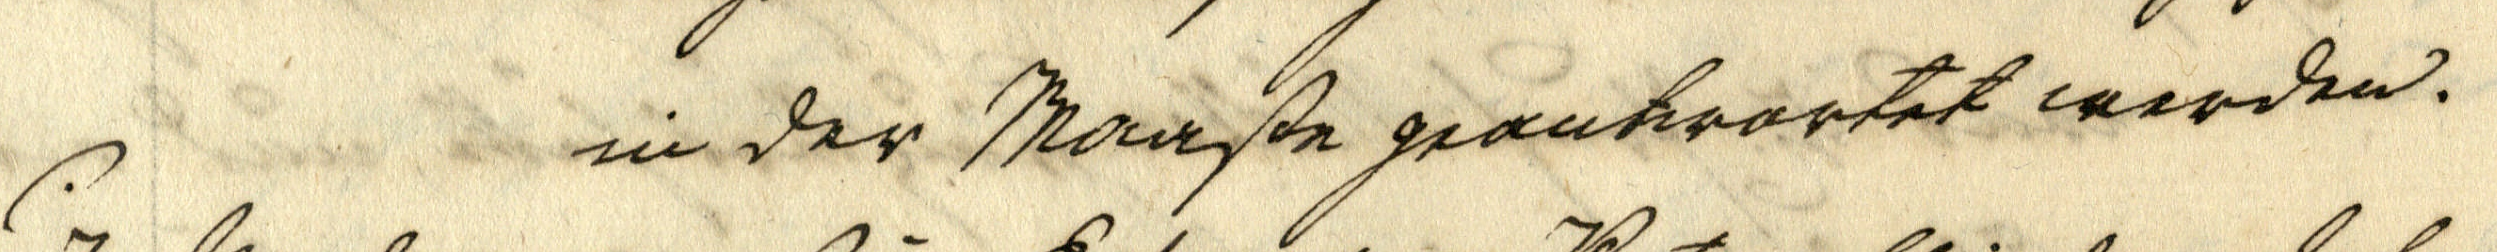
in der Maaße geantwortet werden.
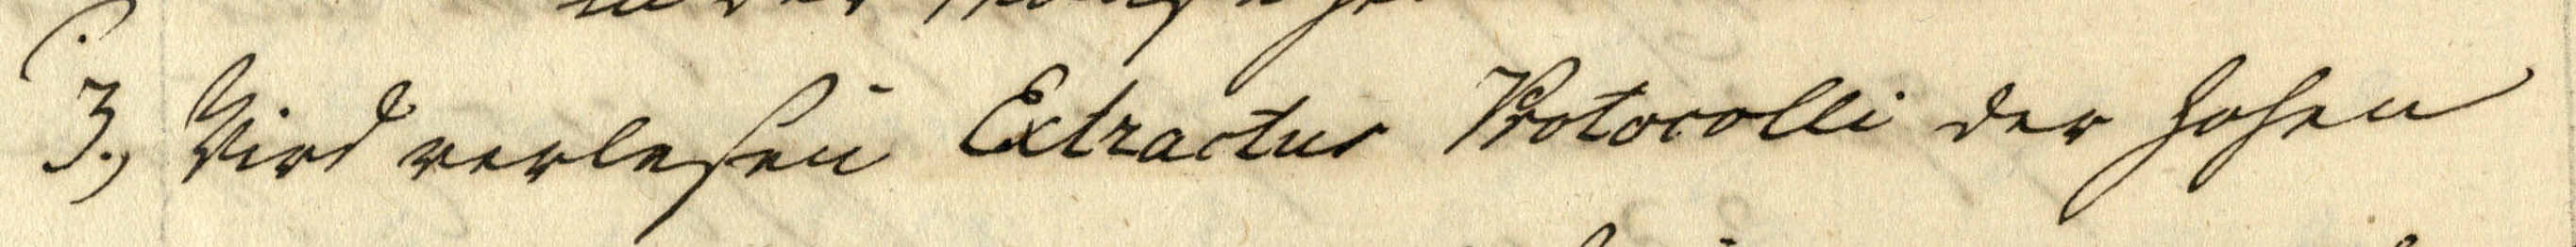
3., Wird verlesen Extractus Protocolli der hohen
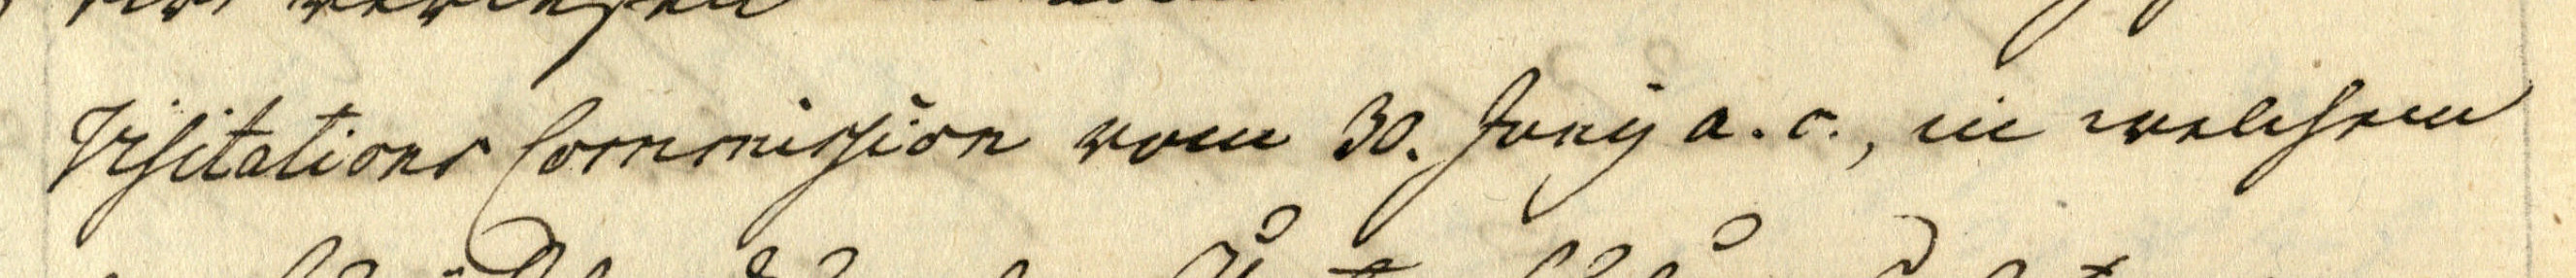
Visitations Commission vom 30. Juny a. c., in welchem
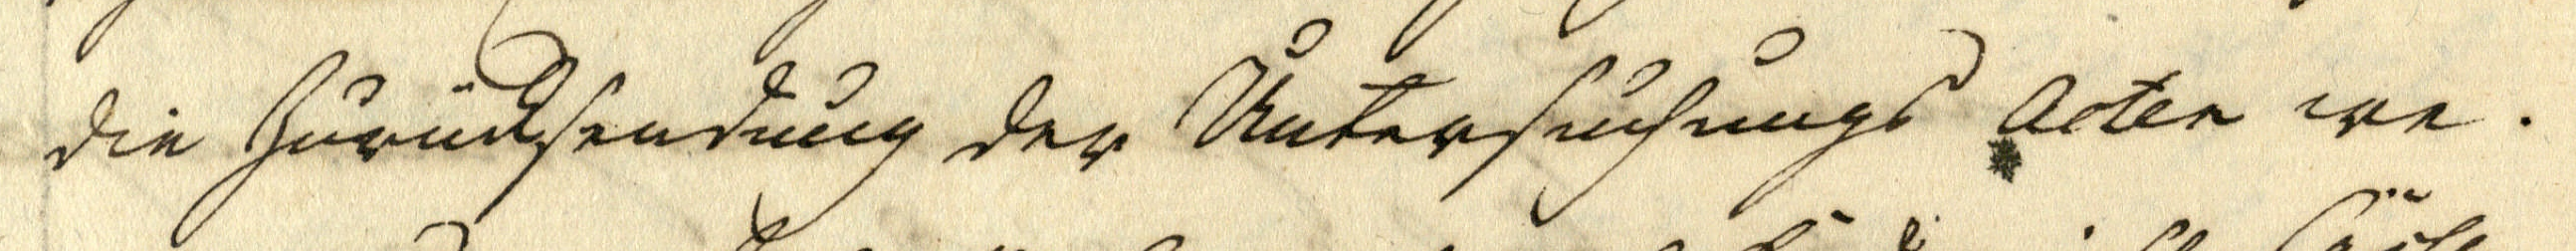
die Zurücksendung der Untersuchungs Acten we-
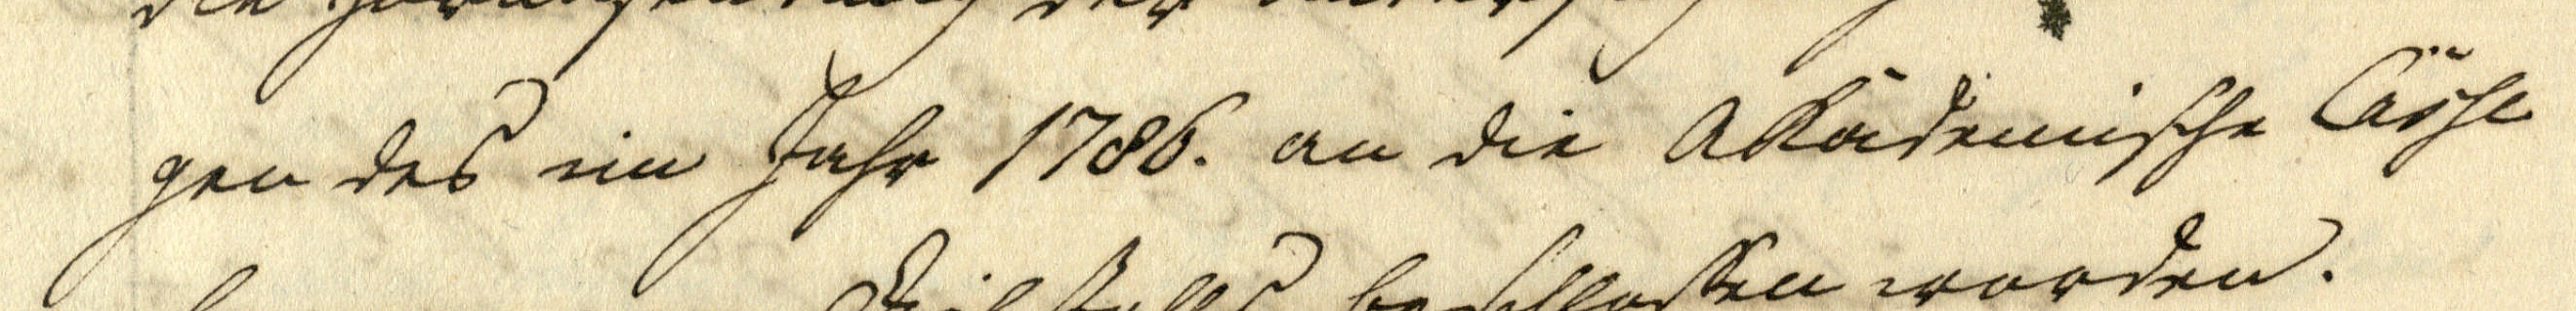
gen des im Jahre 1786. an die Akademische Casse
